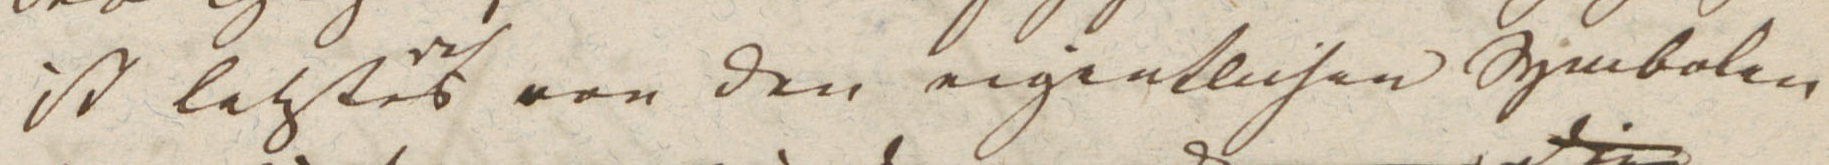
ist letztesres von den eigentlichen Symbolen
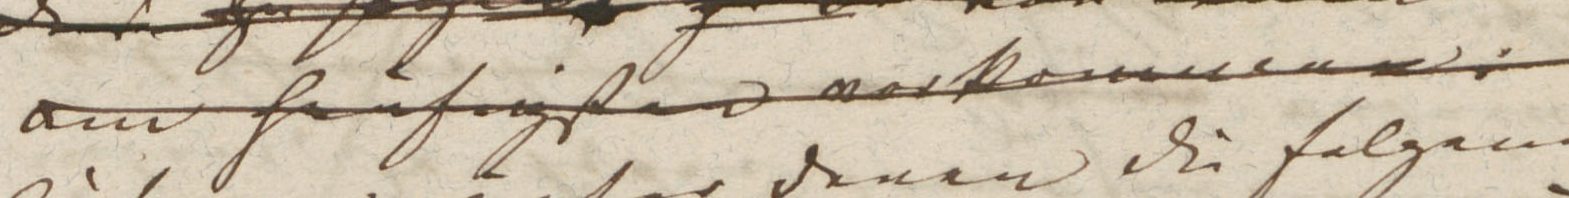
am häufigsten vorkommen
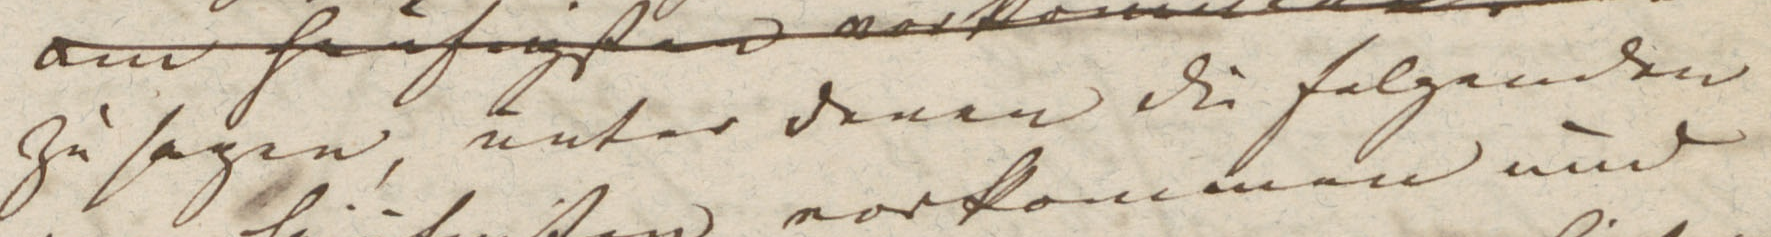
zu sagen, unter denen die folgenden
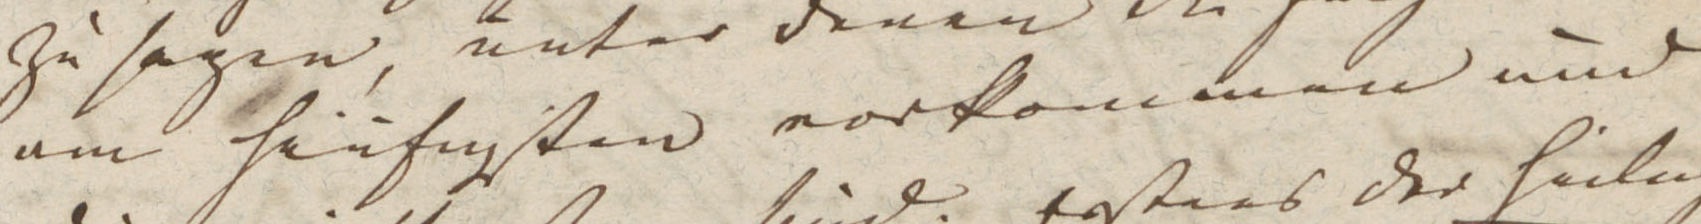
am häufigsten vorkommen und
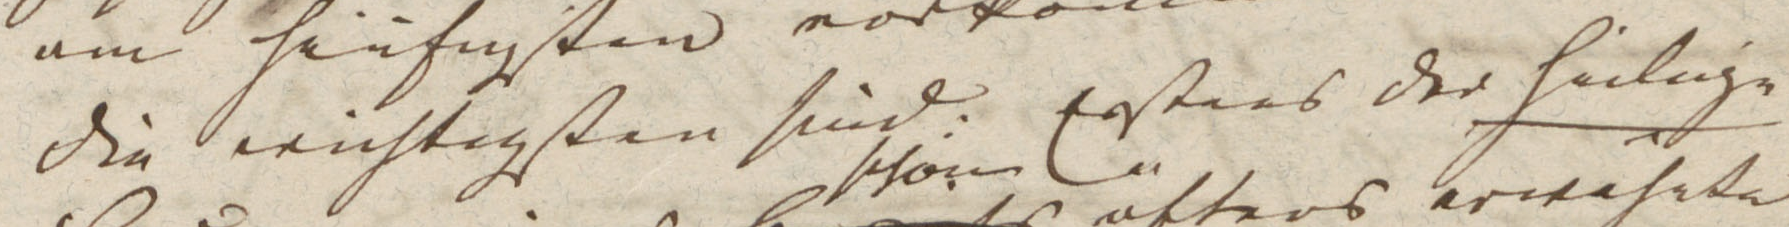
die wichtigsten sind: Erstens der heilige
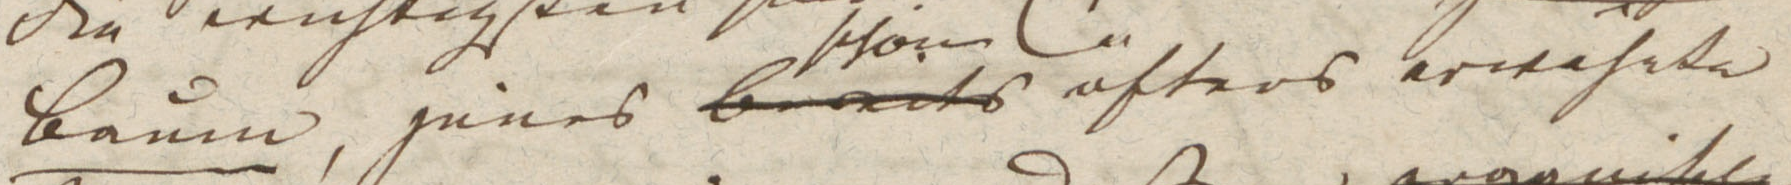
Baum, jenes bereits schon öfters erwähnte
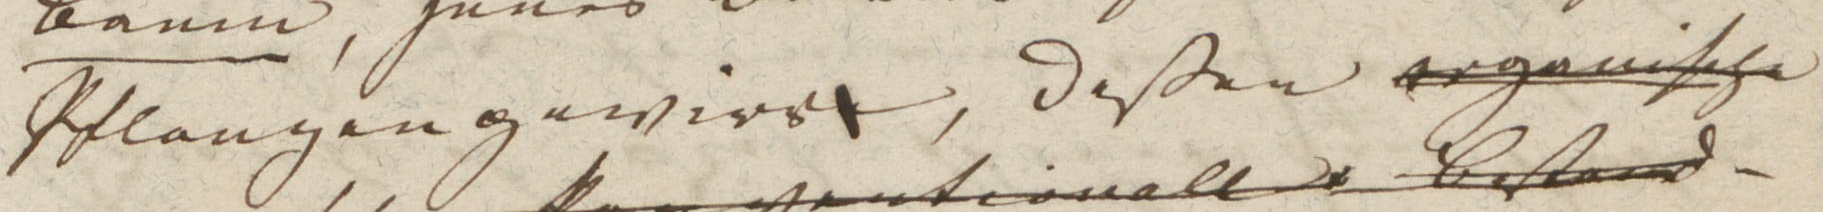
Pflanzengewirre, dessen organische
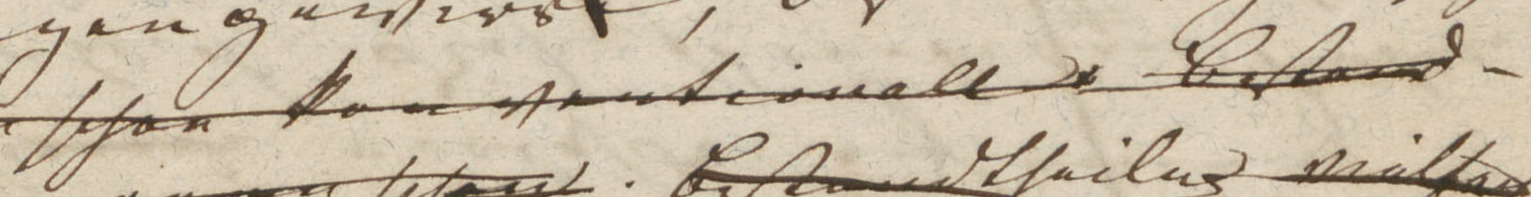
schon konventionelle Bestand-
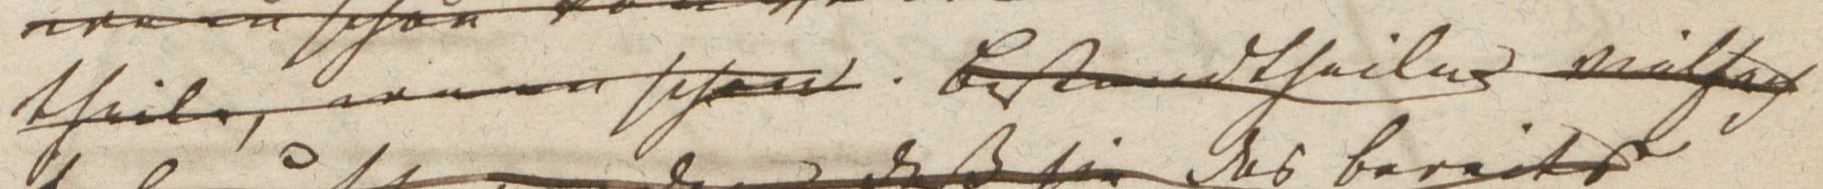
theile, wenn schon. Bestandtheile vielfach
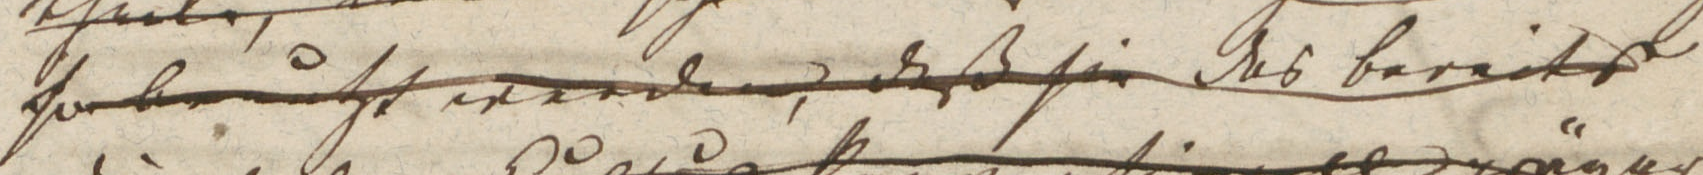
so benutzt werden, dass sie das bereits
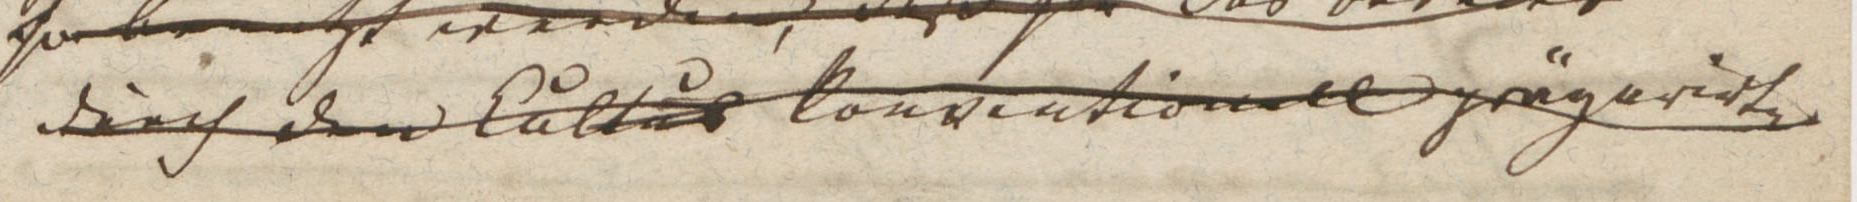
durch den Cultus konventionell präprarirte
